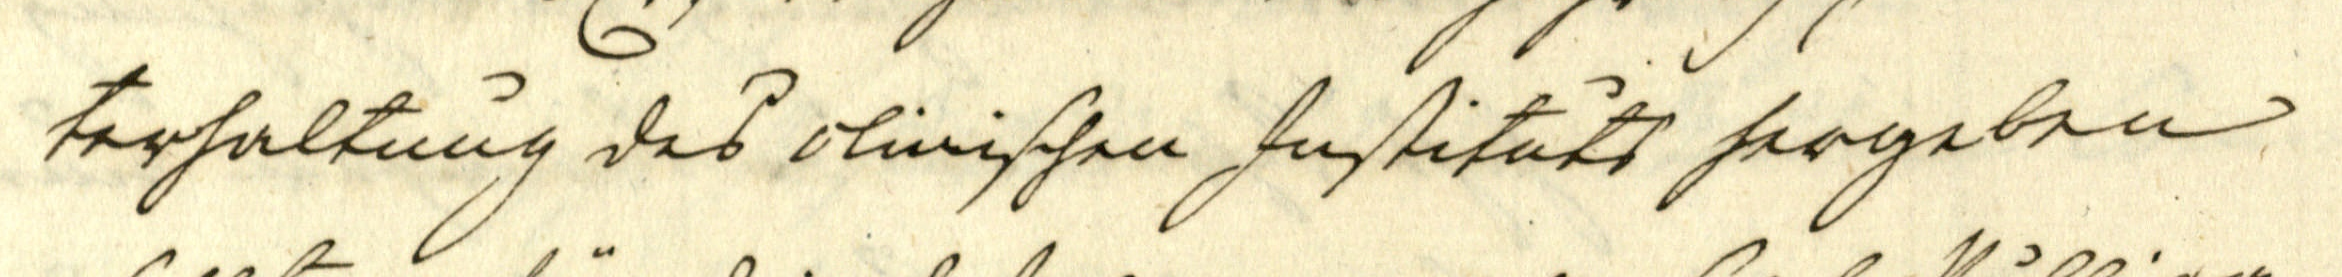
terhaltung des clinischen Instituts hergeben
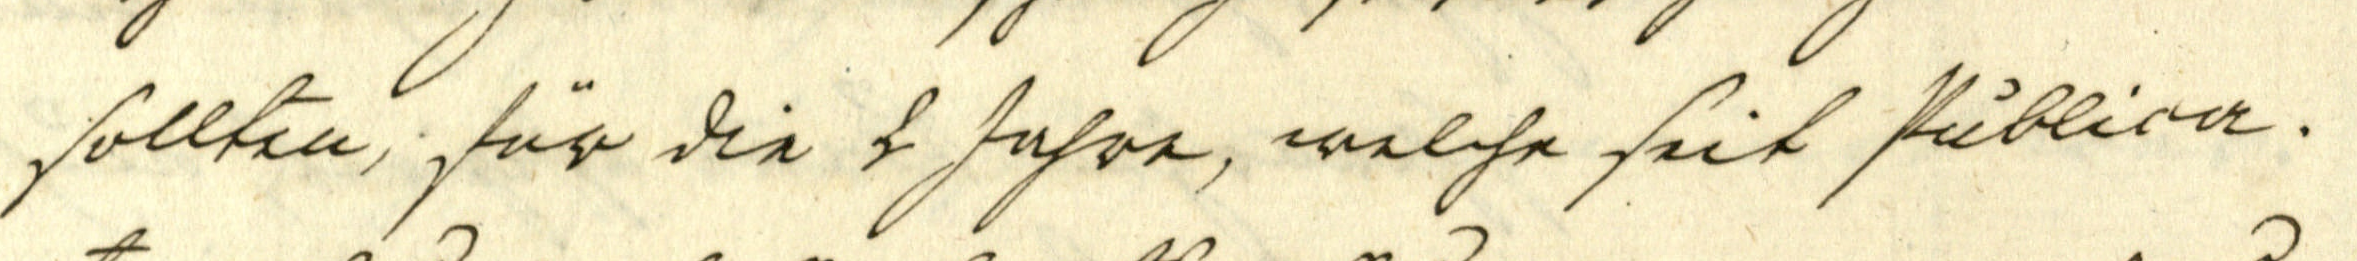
sollten, für die 2 Jahre, welche seit Publica¬
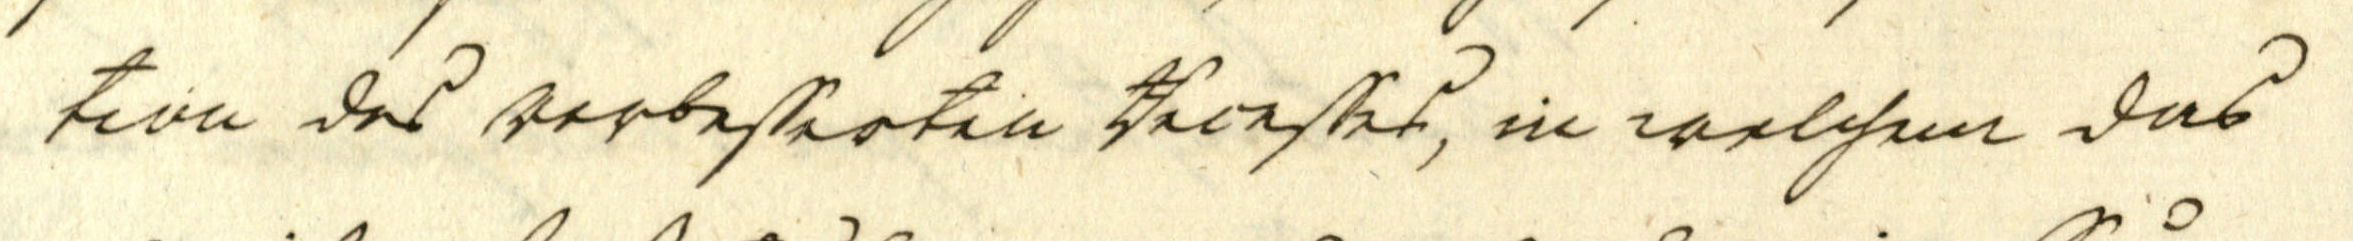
tion des verbesserten Recesses, in welchem das
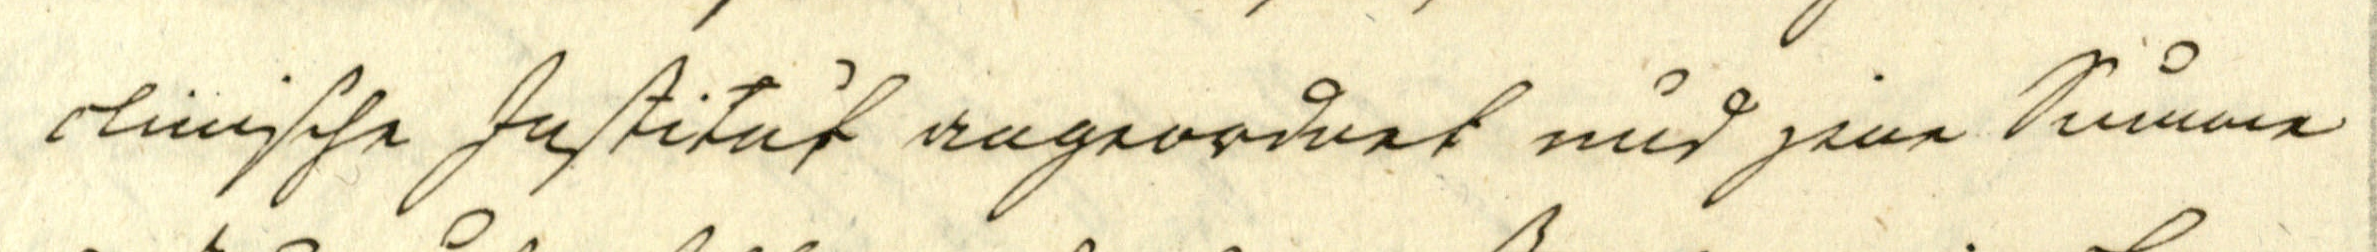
clinische Institut angeordnet und jene Summe
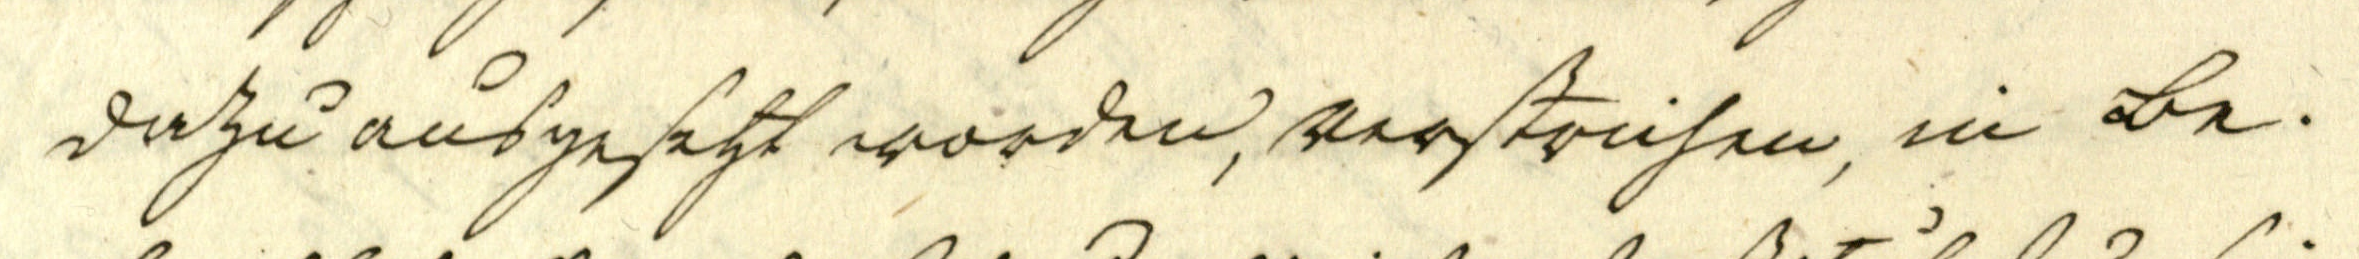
dazu ausgesetzt worden, verstrichen, in Be¬
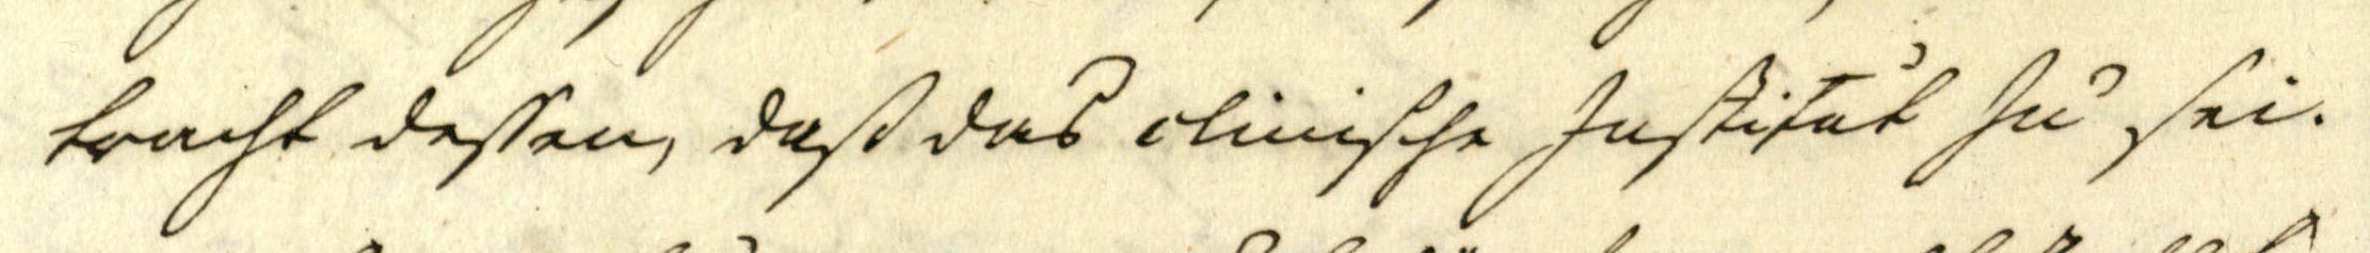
tracht dessen, daß das clinische Institut zu sei¬
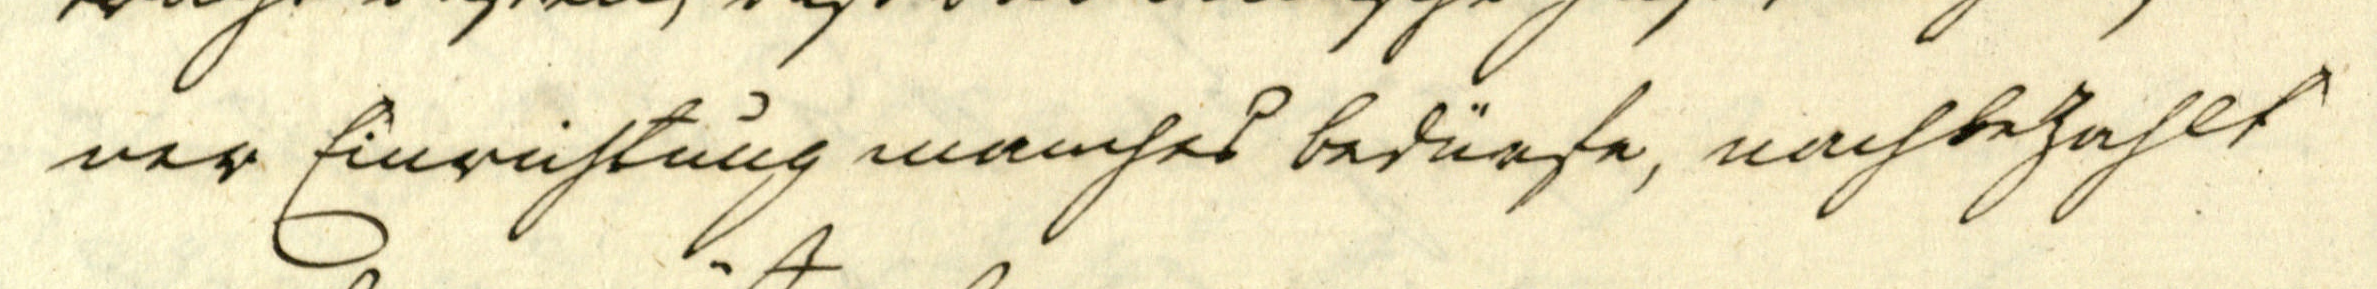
ner Einrichtung manches bedürfe, nachbezahlt
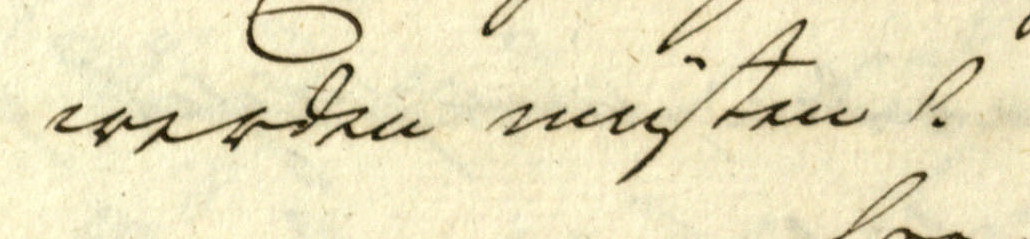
werden müssten?
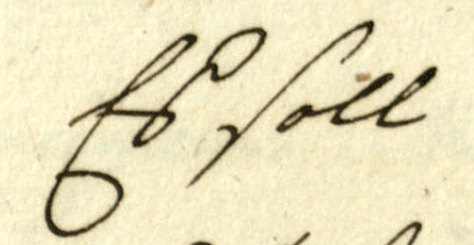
Es soll
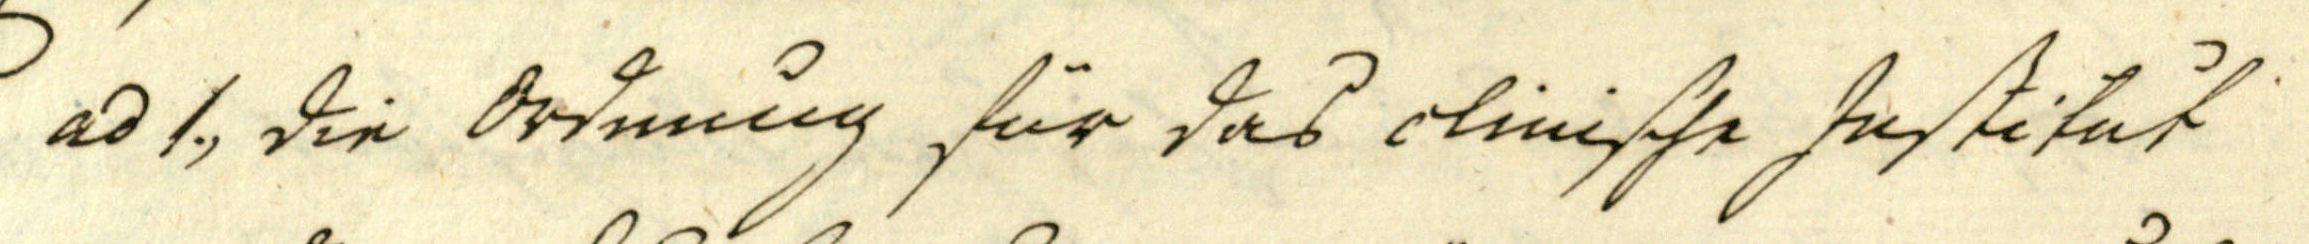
ad 1., die Ordnung für das clinische Institut
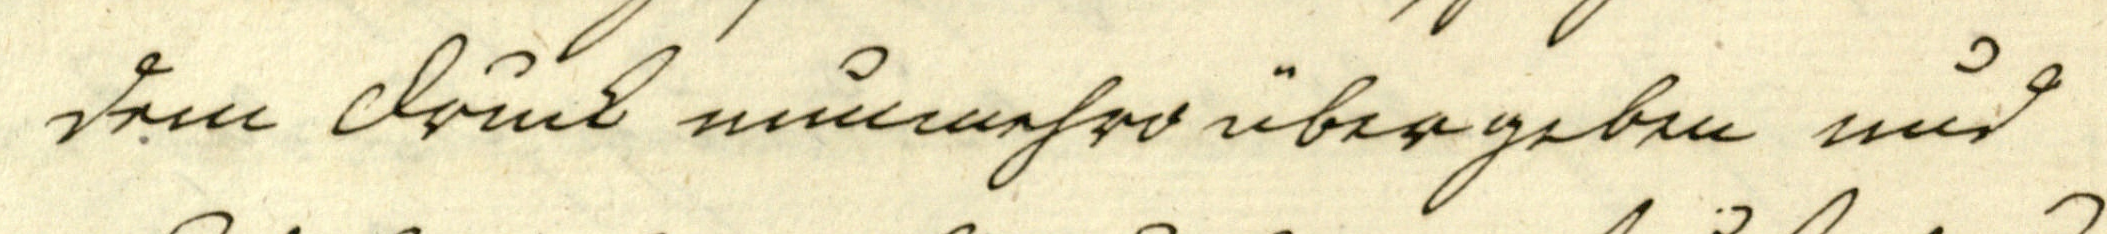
dem Druck nunmehro übergeben und
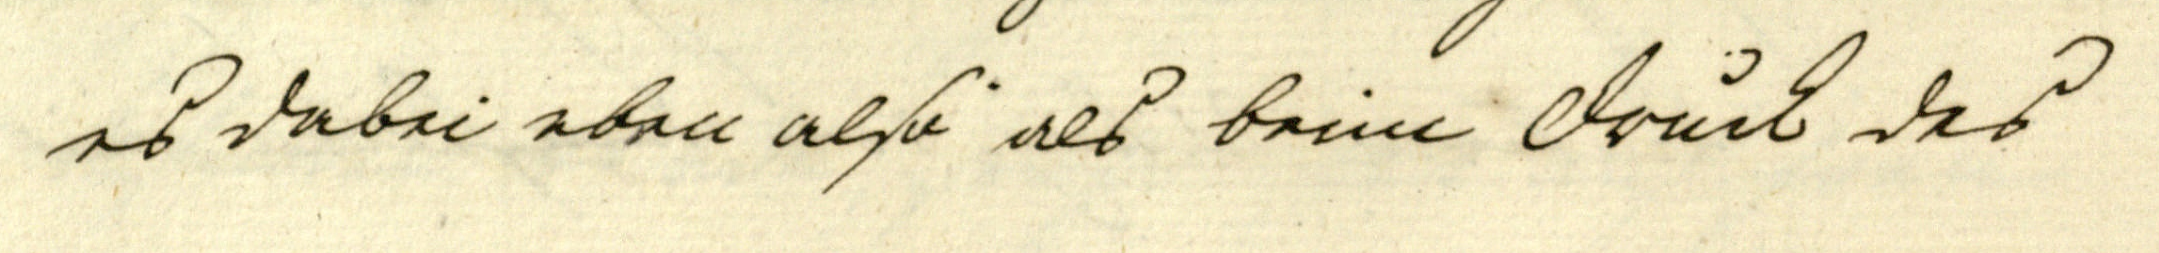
es dabei eben also als beim Druck des
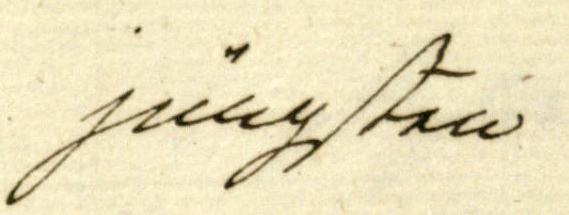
jüngsten
